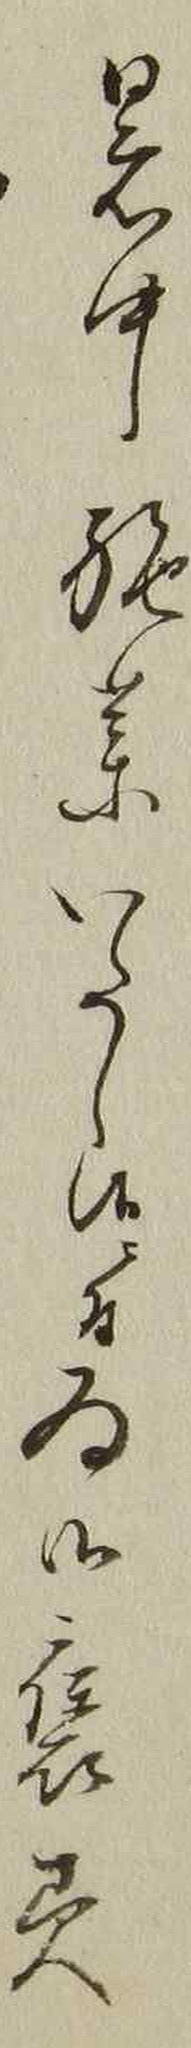暑中施薬いたし候ニ付為御褒美
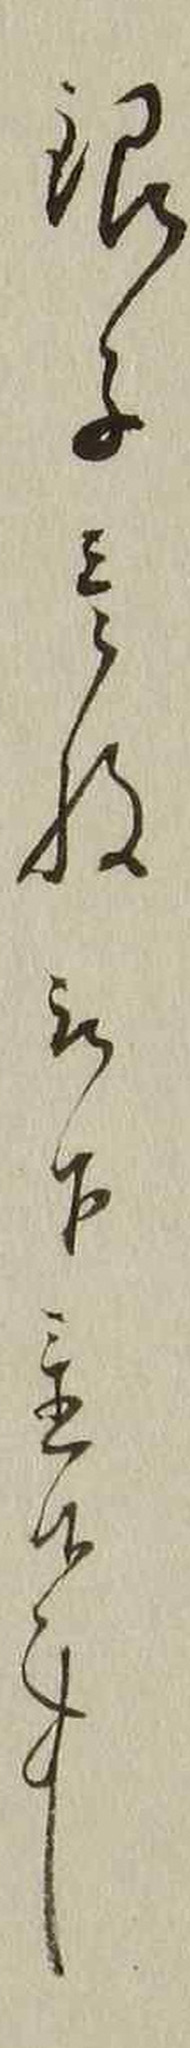銀子壱枚被下置候事
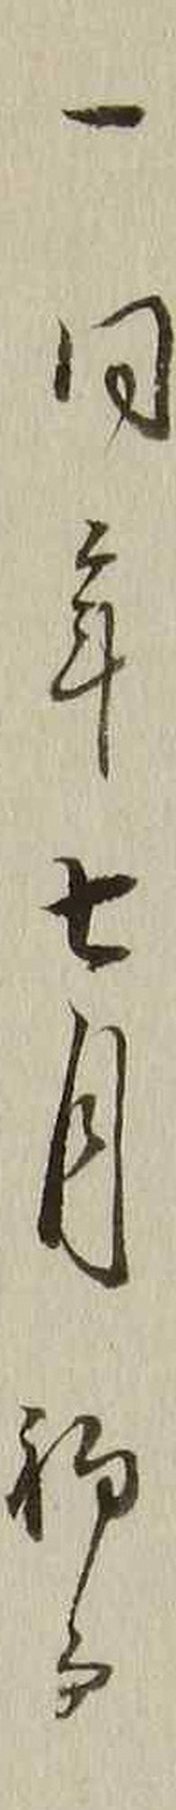一同年七月初而
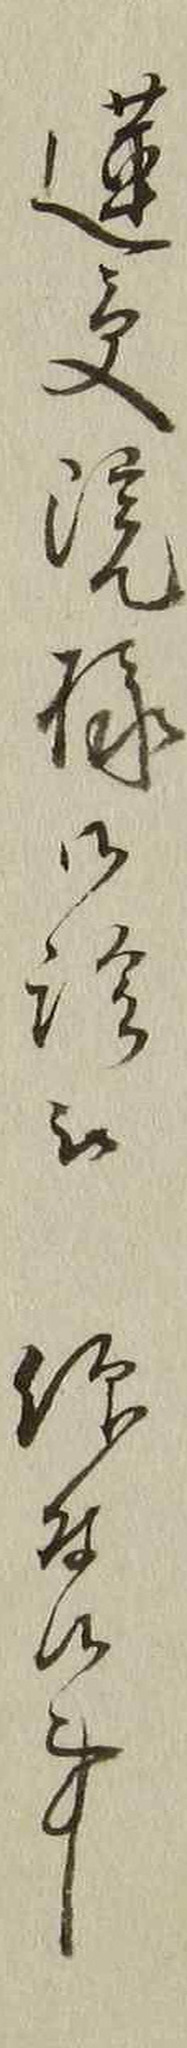蓮受院様御診被仰付候事
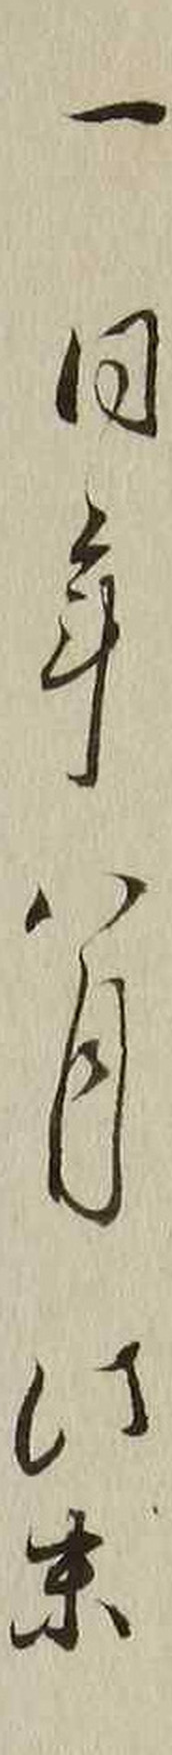一同年八月此末
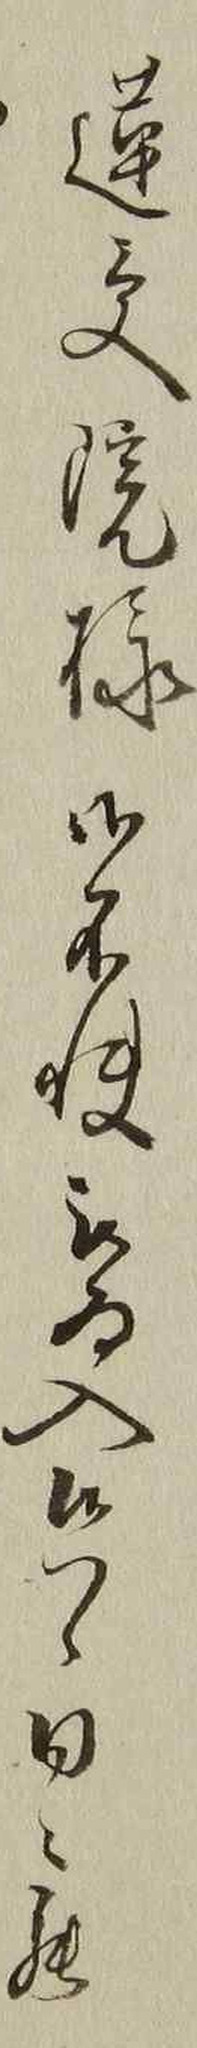蓮受院様御不快被為入候ハヽ日々罷
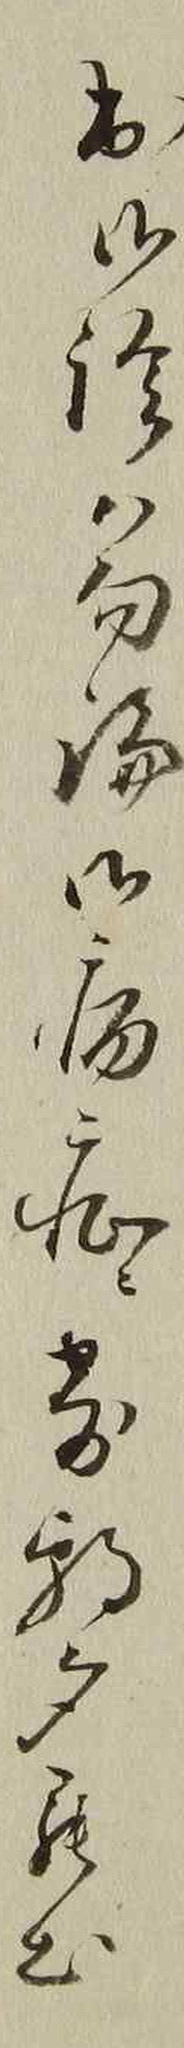出御診ハ勿論御病症ニ寄朝夕罷出
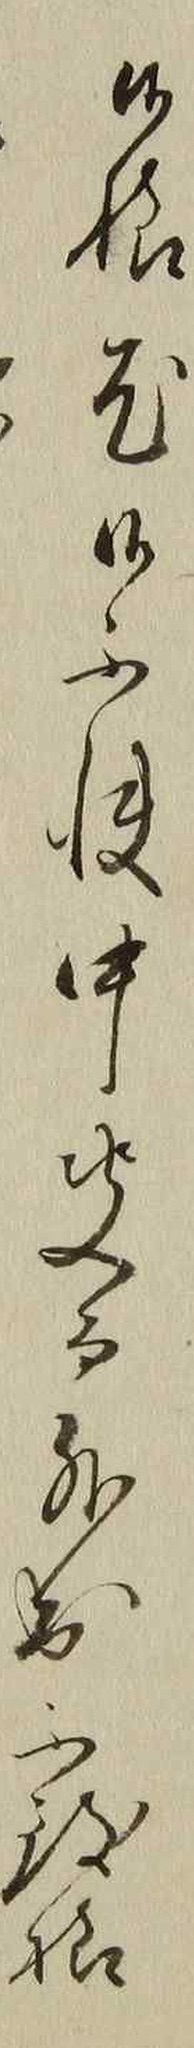候様尤御不扶中決而外出不致様
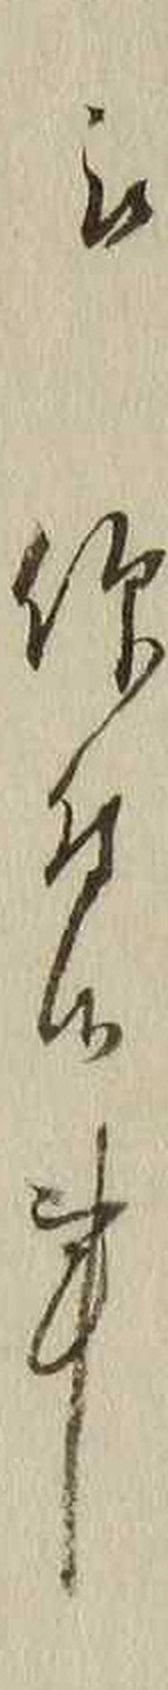被仰付候事
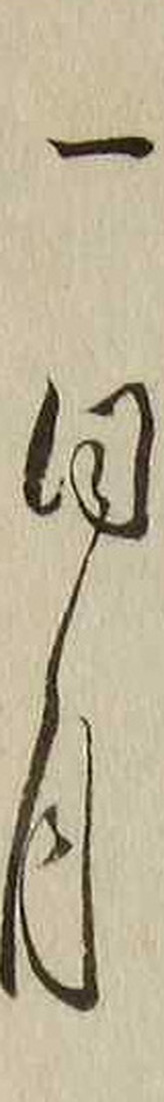一同月
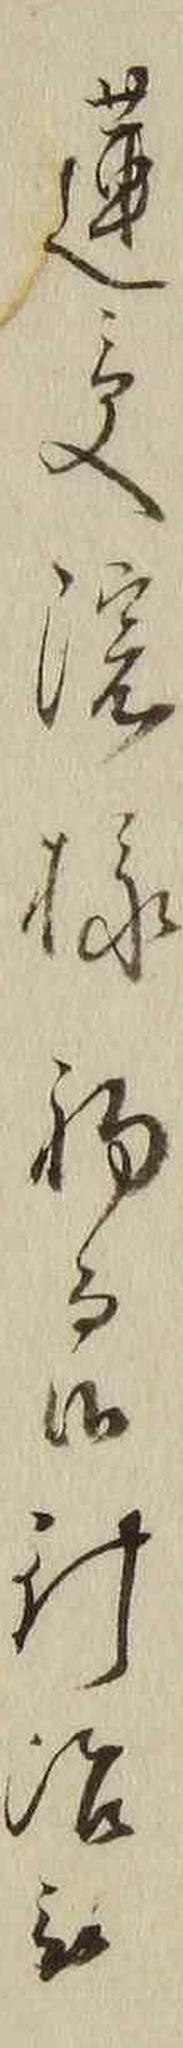蓮受院様初而御針治被
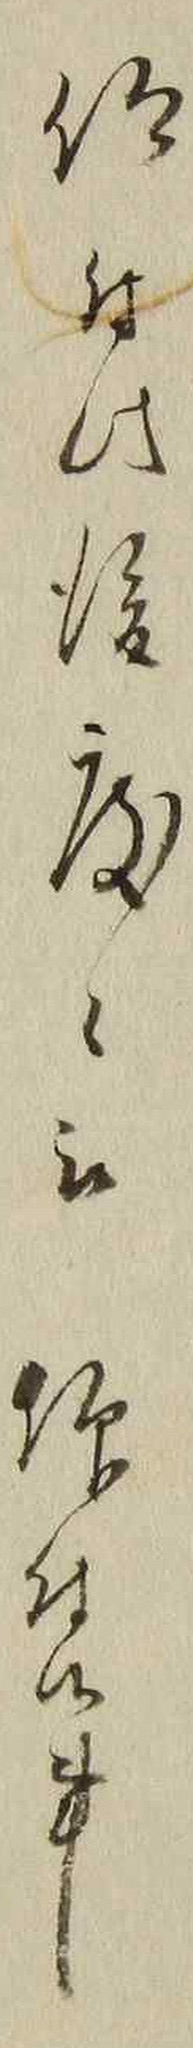仰付此後度々被仰付候事
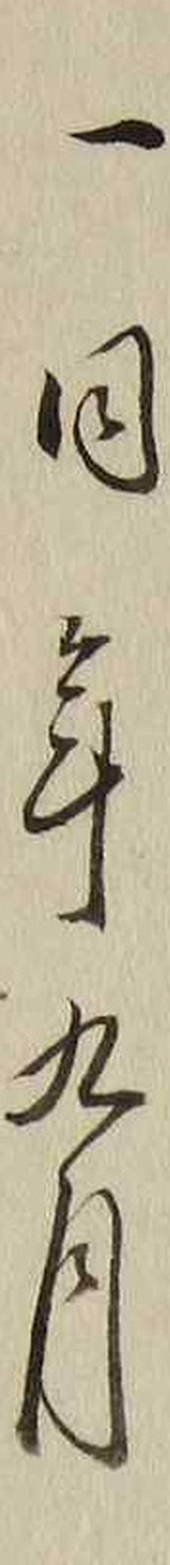一同年九月
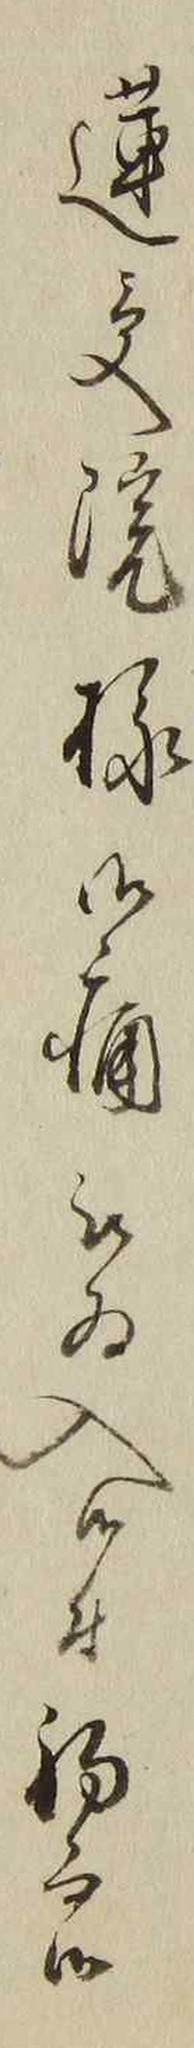蓮受院様御痛被為入候付初而御
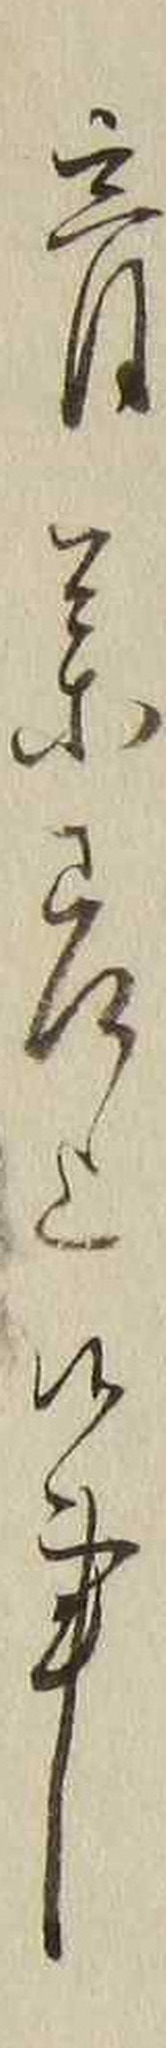膏薬差上候事
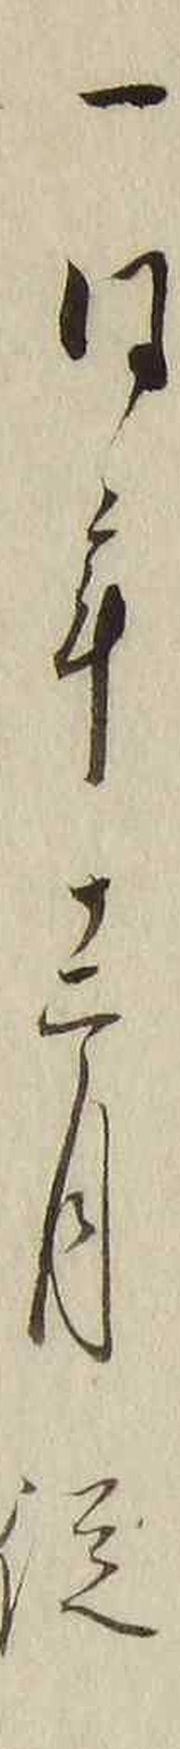一同年十二月従
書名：諸士系譜　巻之129　た之部5
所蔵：会津若松市立会津図書館
